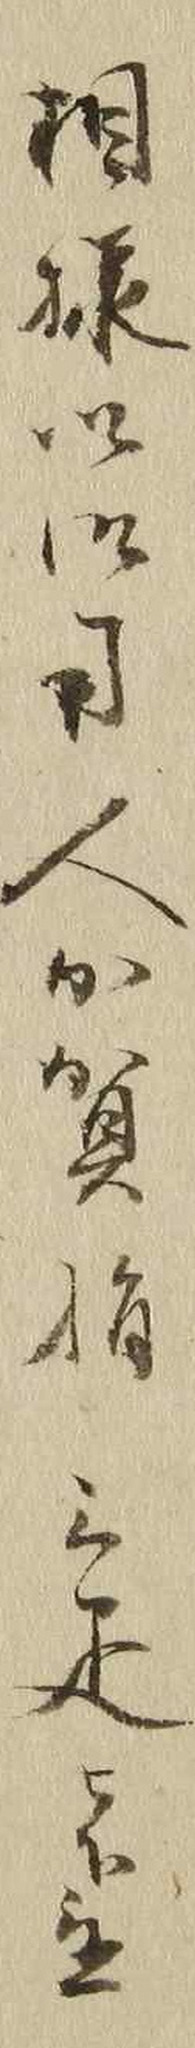相様以御用人加賀絹三疋被下置
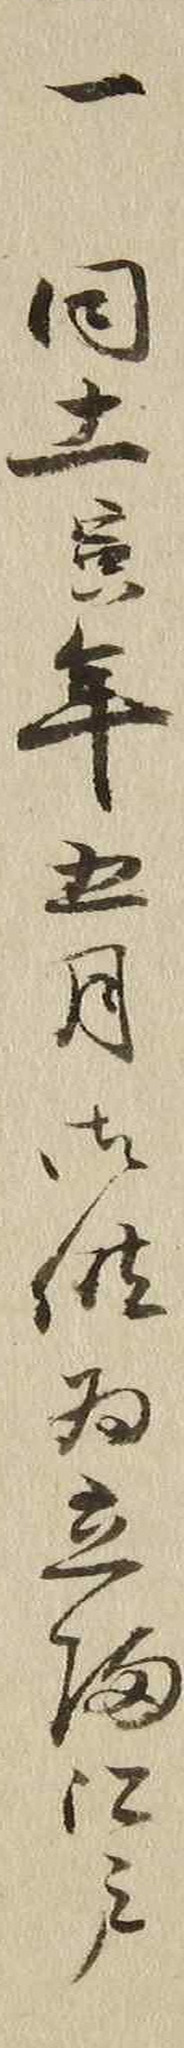一同十一寅年五月御供為立帰江戸
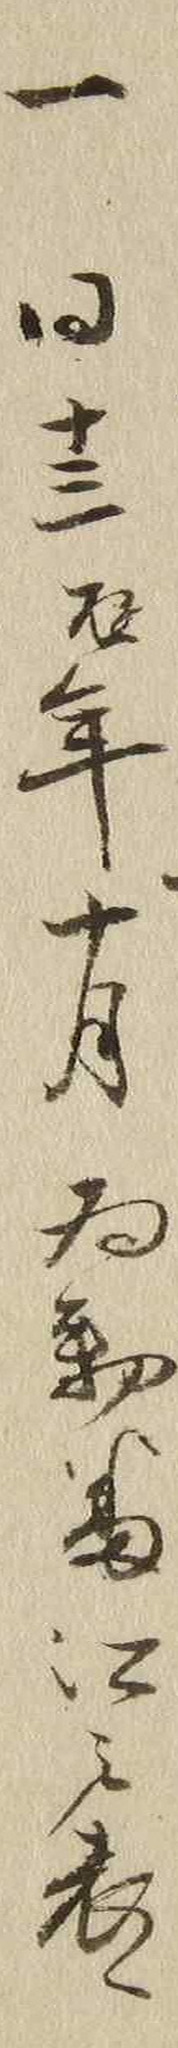一同十三辰年十月為勤番江戸表へ
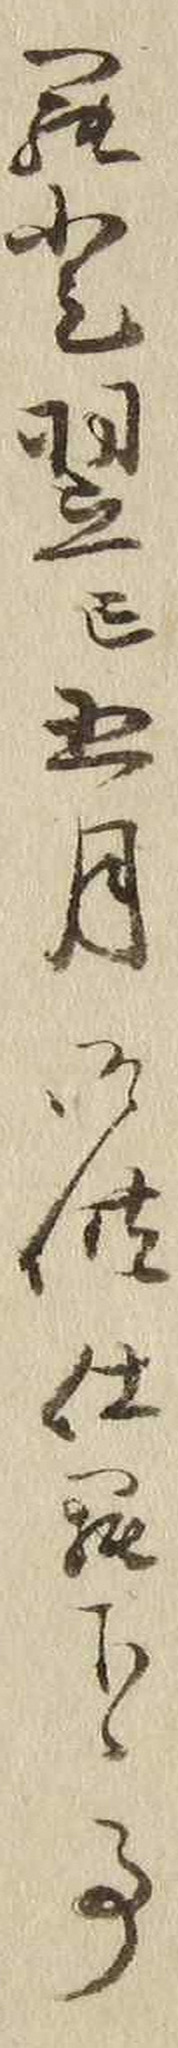罷登翌巳五月御供仕罷下候事
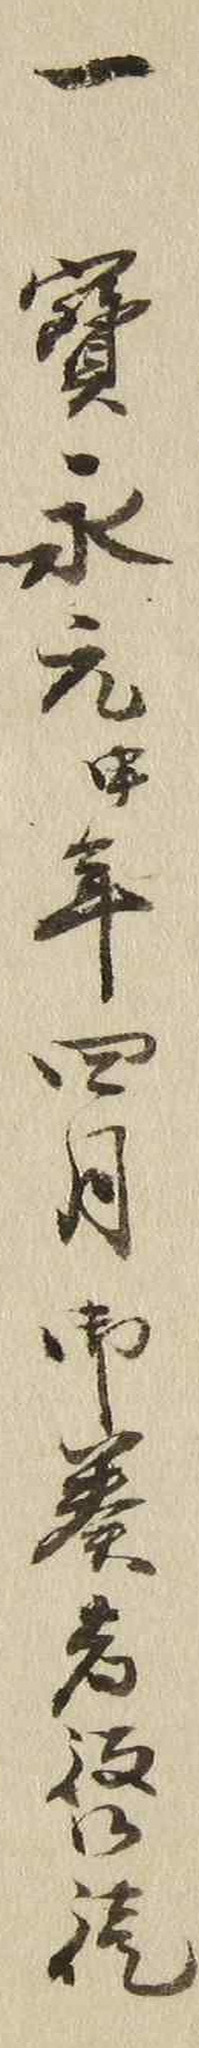一宝永元申年四月御奏者役御徒
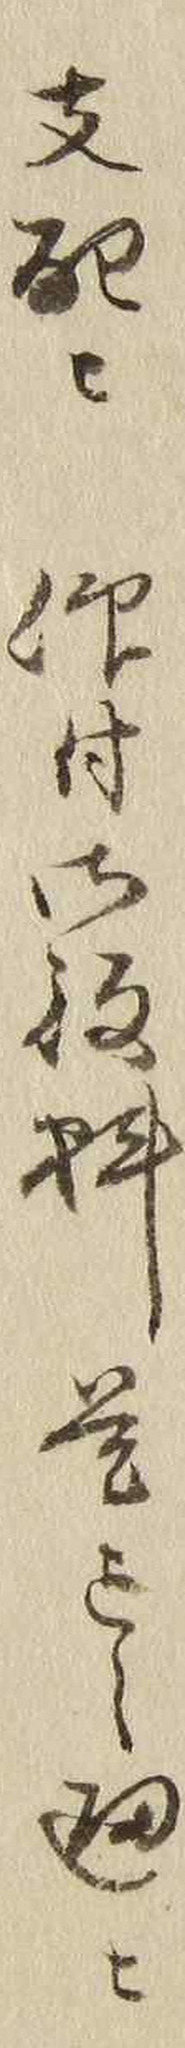支配被仰付御役料是迄之通被
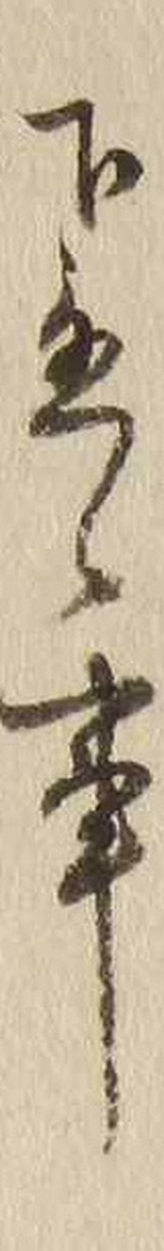下置候事
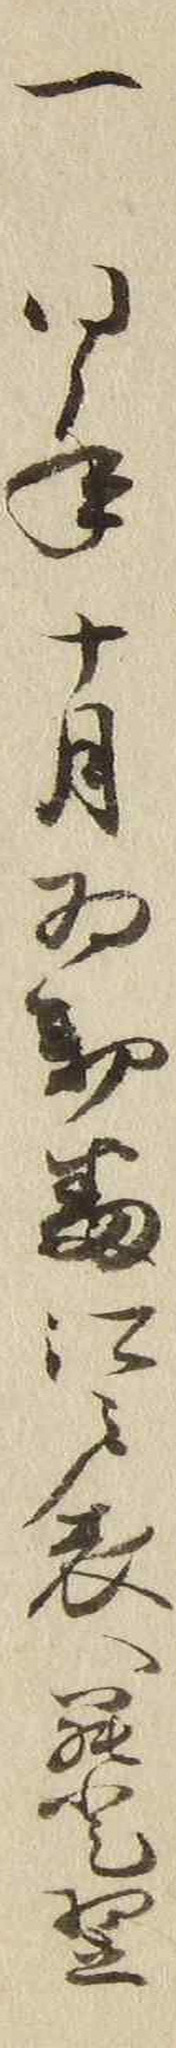一同年十月為勤番江戸表へ罷登翌
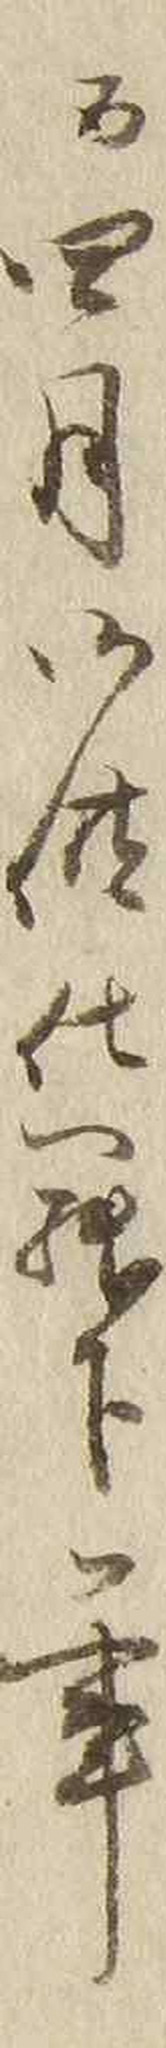酉四月御供仕罷下候事
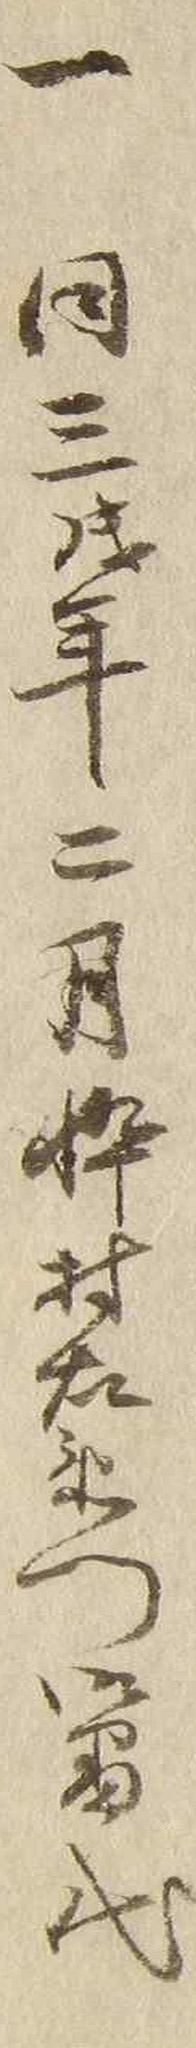一同三戌年二月忰村右衛門御番代

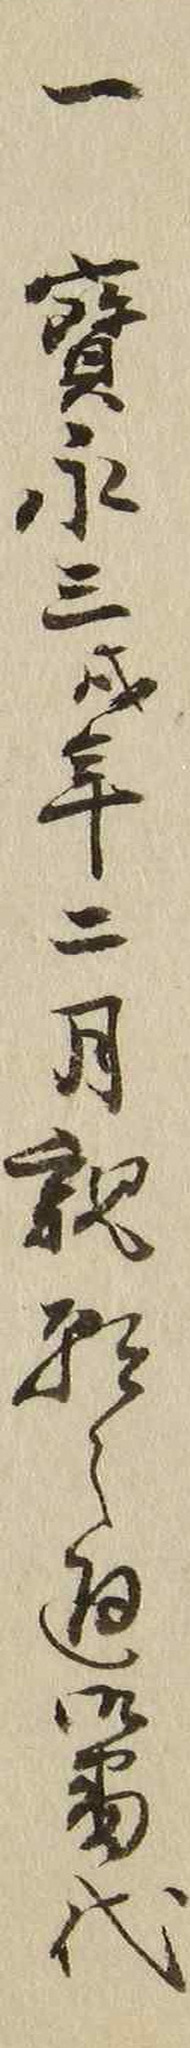一宝永三戌年二月親願之通御番代
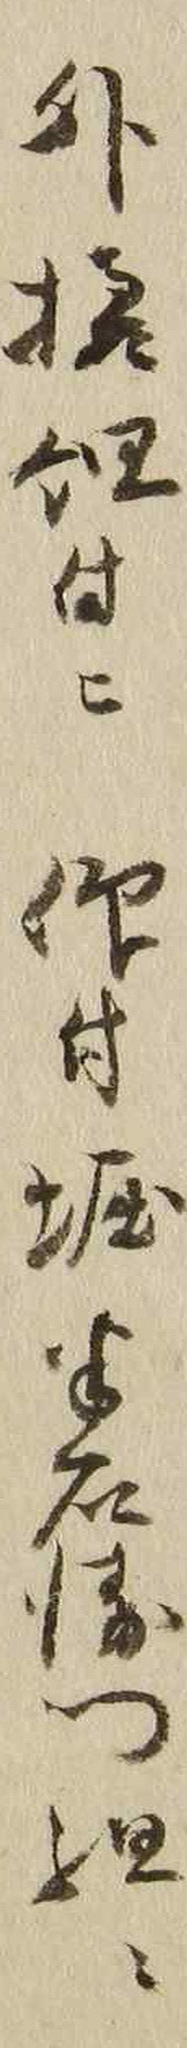外様組付被仰付堀半右衛門組ニ
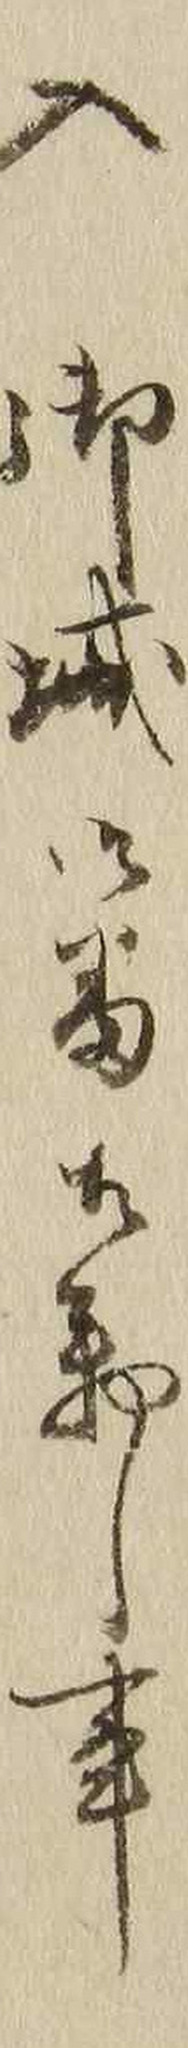入御城御番相勤候事
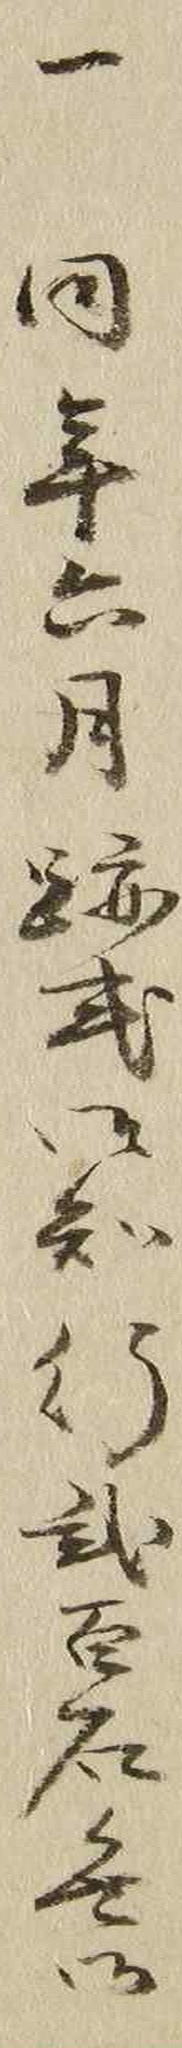一同年六月跡式御知行弐百石無御
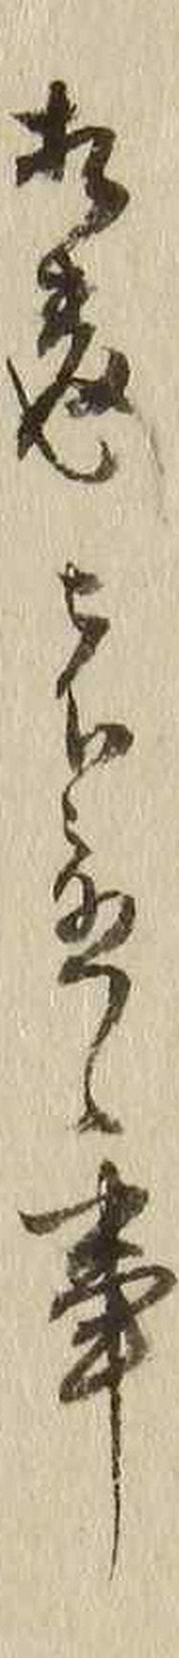相違被下置候事
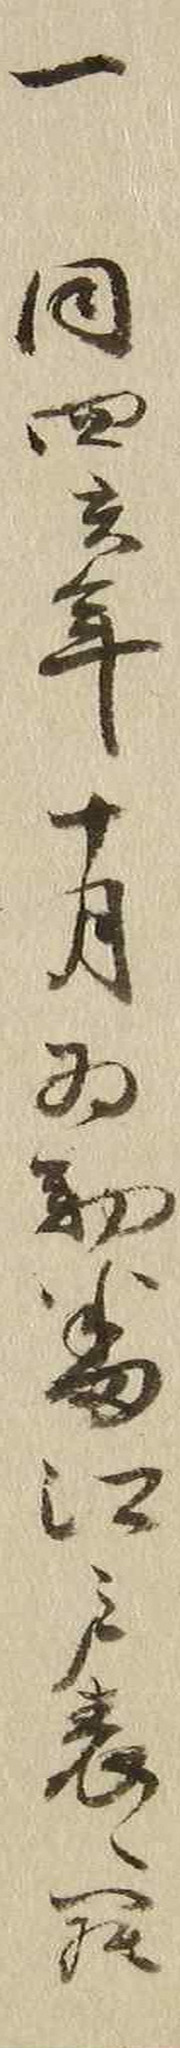一同四亥年十月為勤番江戸表へ罷
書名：諸士系譜　巻之225　ま之部6
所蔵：会津若松市立会津図書館
